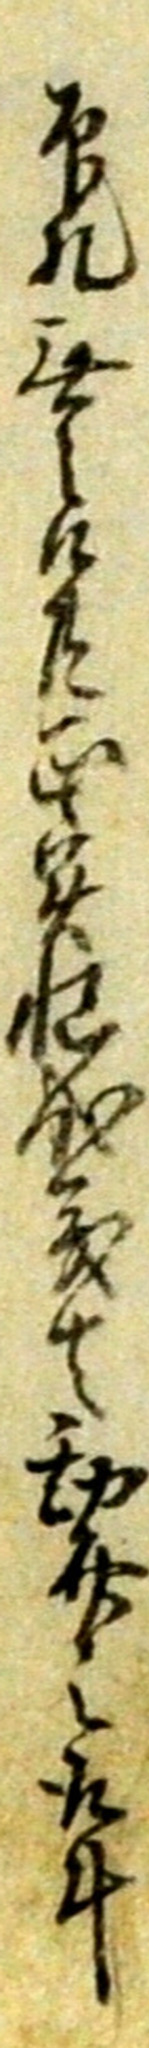印札無之候共正実慥成儀者勘弁之取斗
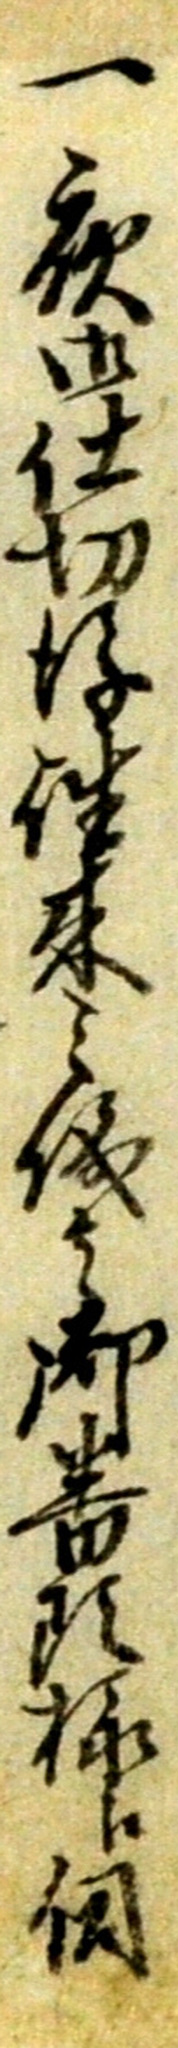一夜御仕切後往来之儀御番頭様江伺
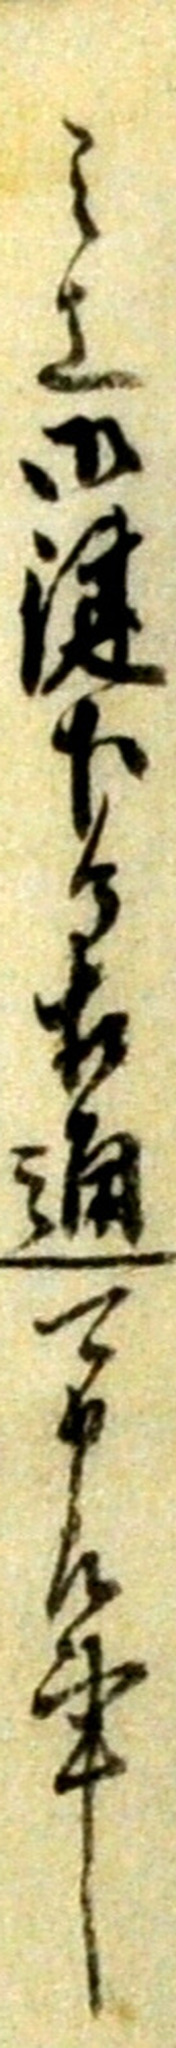之上御鍵下ケ相通可申候事
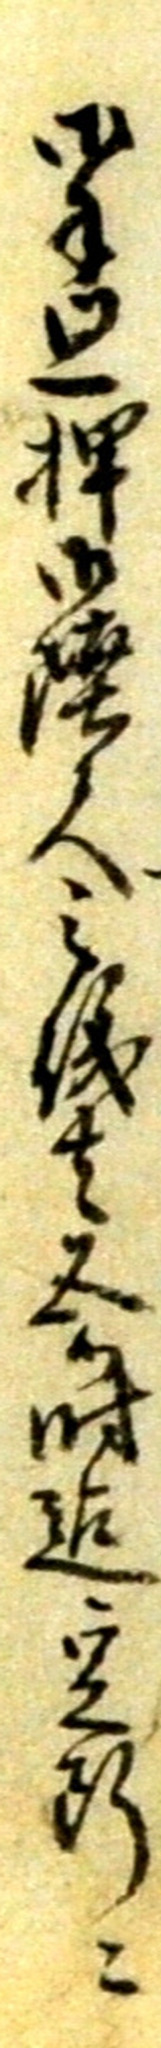御手廻押御陸尺之儀者五ツ時迄定断ニ

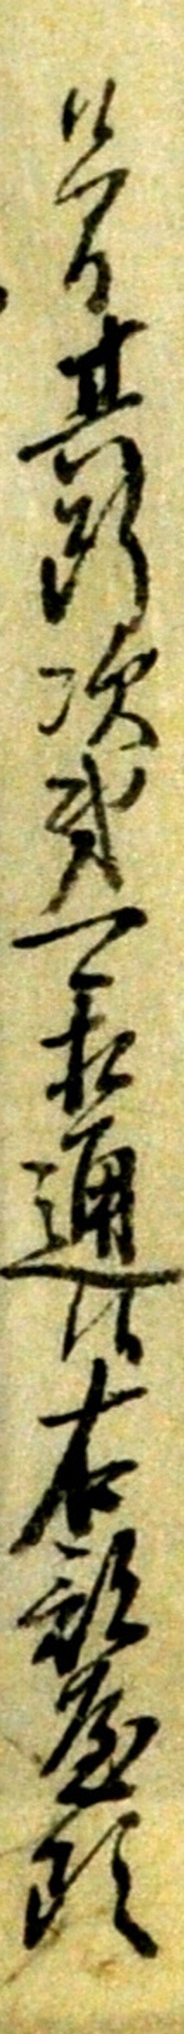候間其断次第可相通候右部屋頭
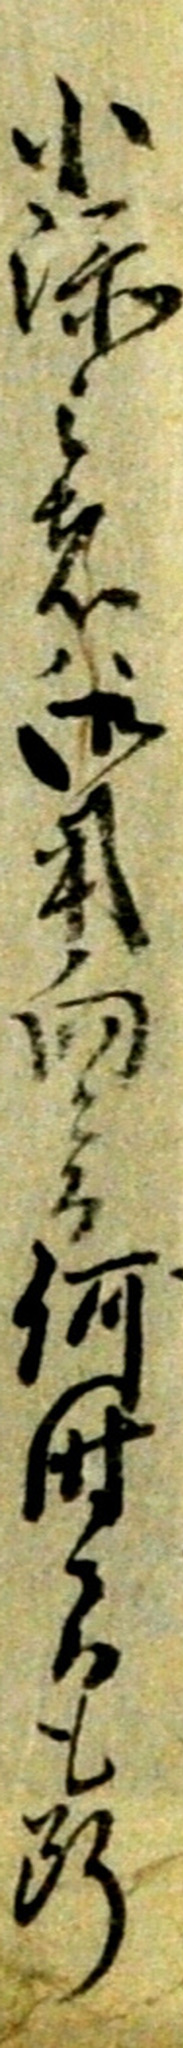小添之者ハ御用向ニ而何時ニ而も断
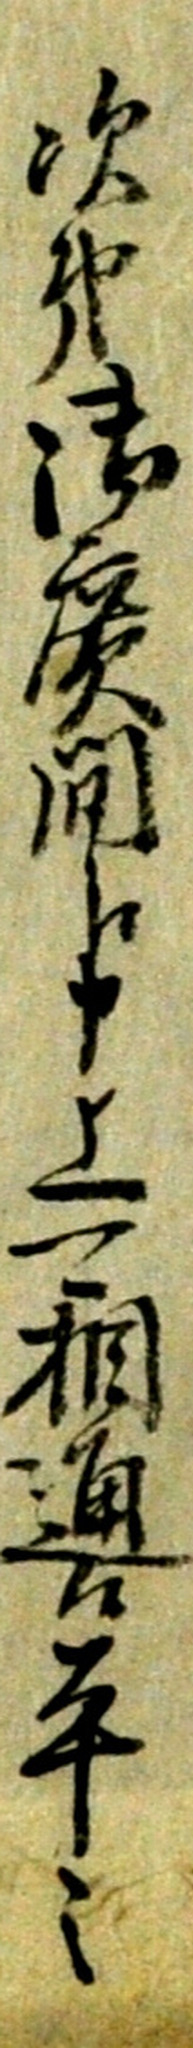次第御広間江申上可相通候平之
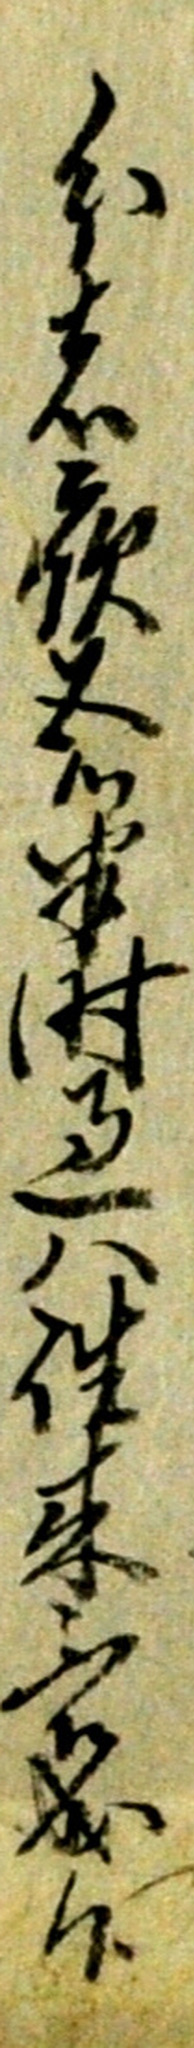分者夜五ツ半時過ハ往来不被成候
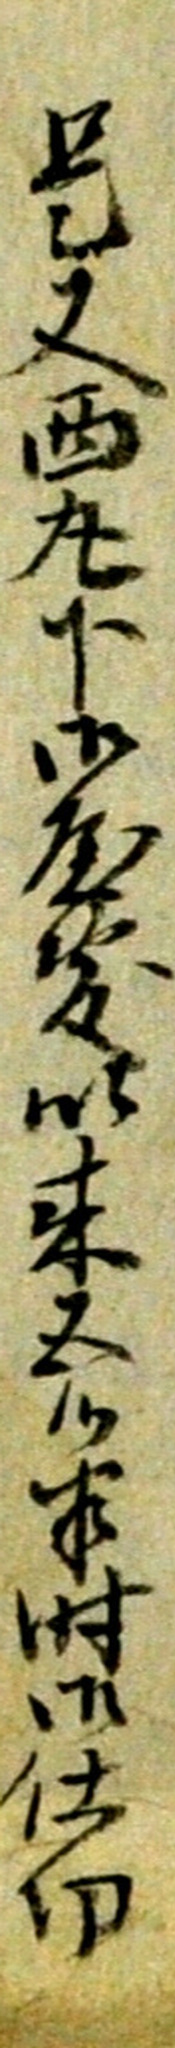是又西丸下御屋敷昨来五ツ半時御仕切
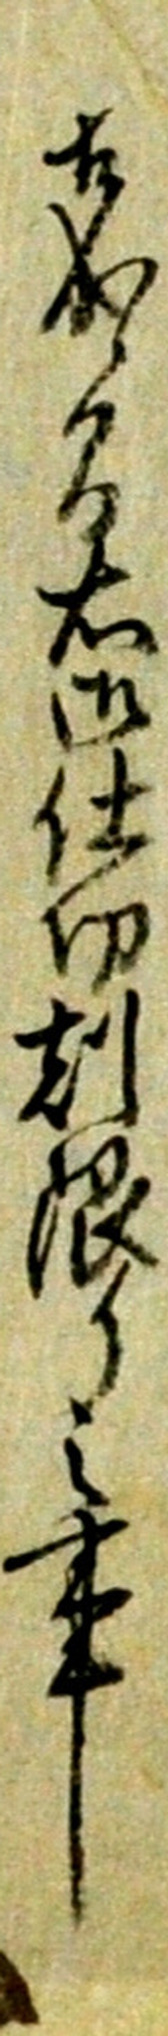相成候間右御仕切刻限り之事
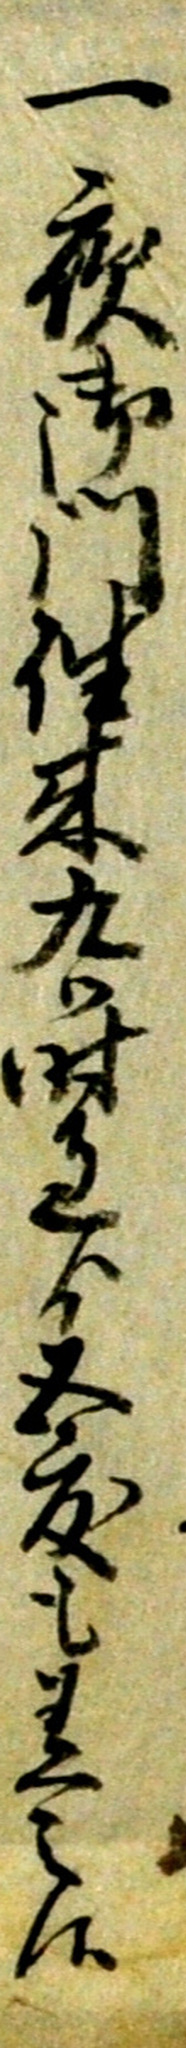一夜御門往来九ツ時過ゟ五度も有之候
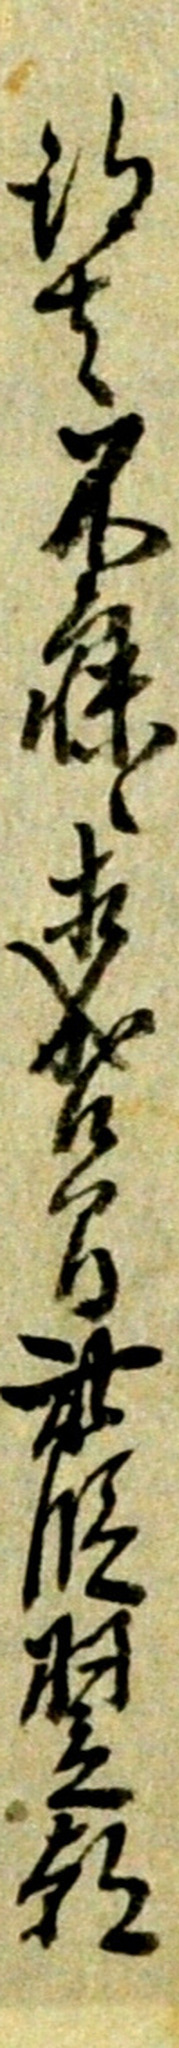得者不寝ニ相成候間此段翌朝
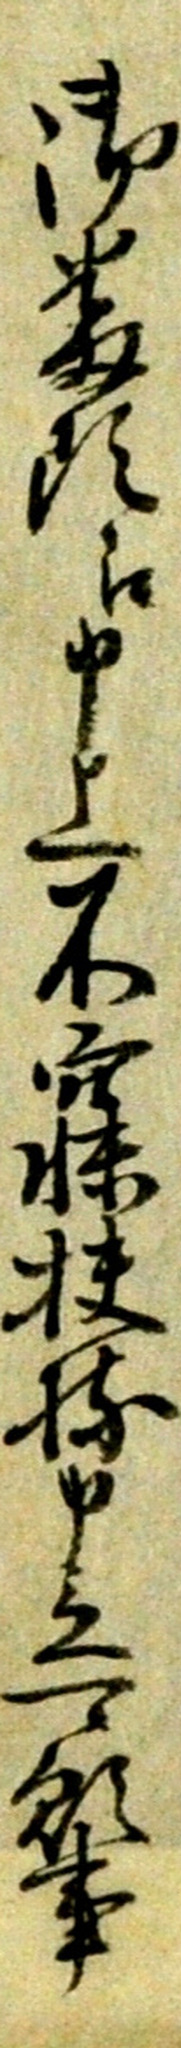御番頭江申上不寝扶持申立可願事
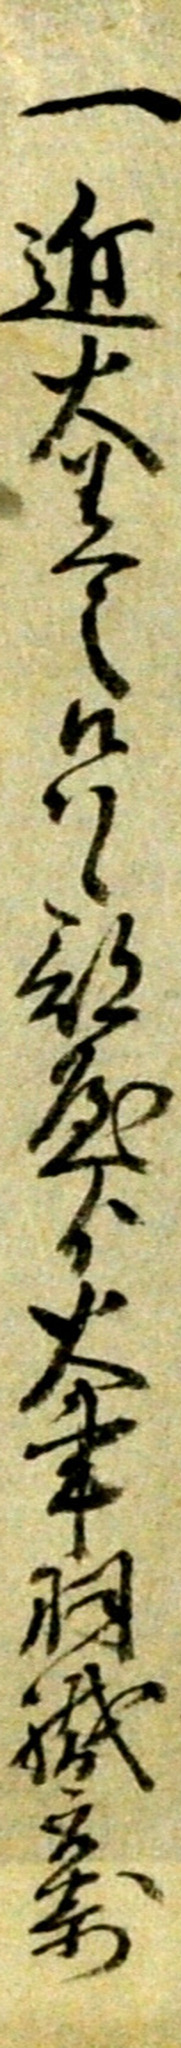一近火有之候ハヽ部屋ゟ火事羽織取寄
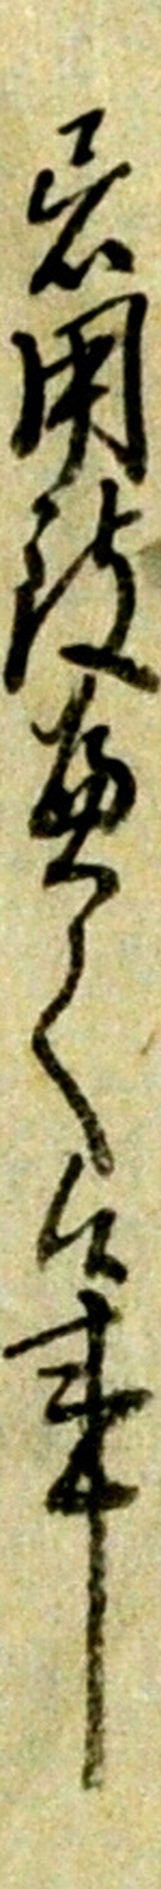着用致へく候事
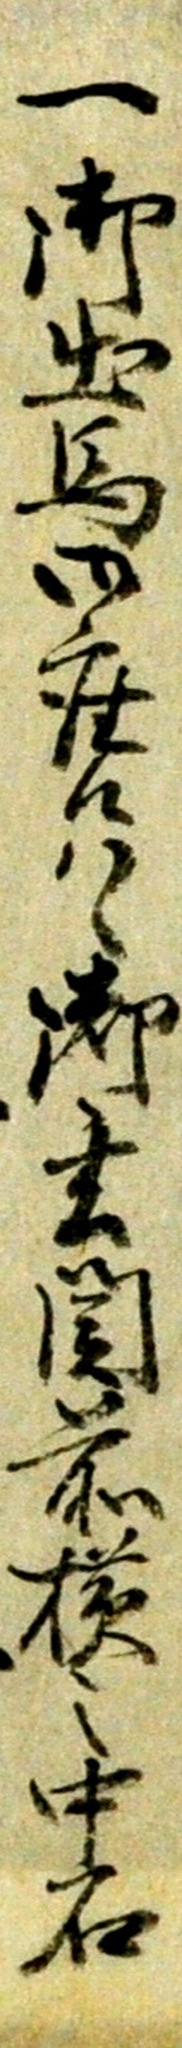一御出馬御座候ハヽ御玄関前横之中石
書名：御先手組江戸御屋敷御門番勤方
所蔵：伊那市立高遠町図書館・合同会社AMANE
